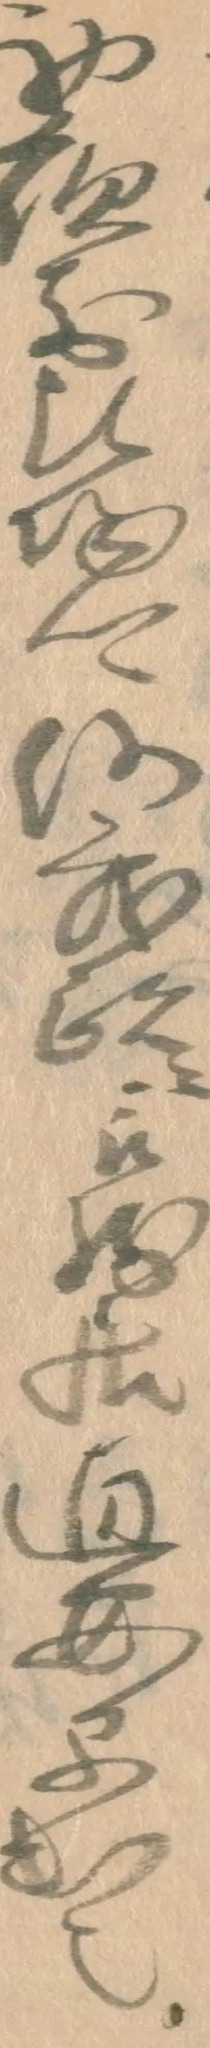初夜前比帰郷何茂跡ニ被残居直安早出也
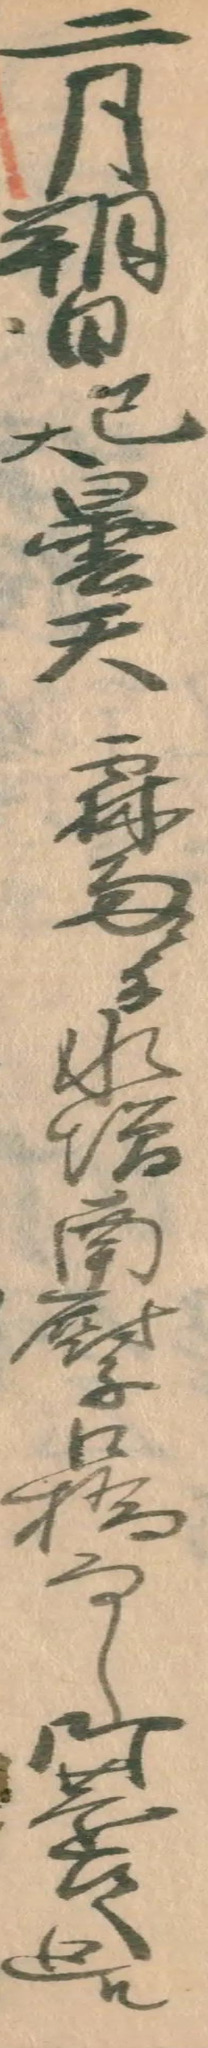二月朔日巳大曇天霖雨ニ而水増南厨子口橋なし御薗口へ廻ル
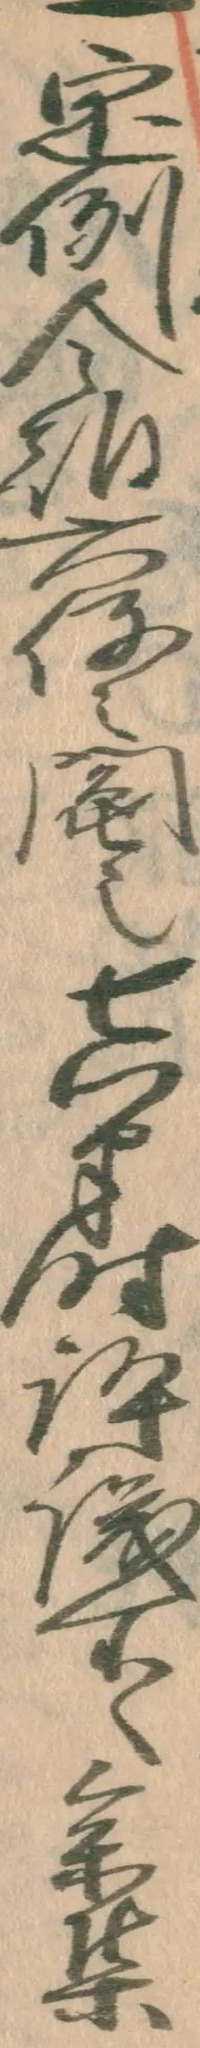一定例今朝六役之鬮也七ツ半時評議所へ参集
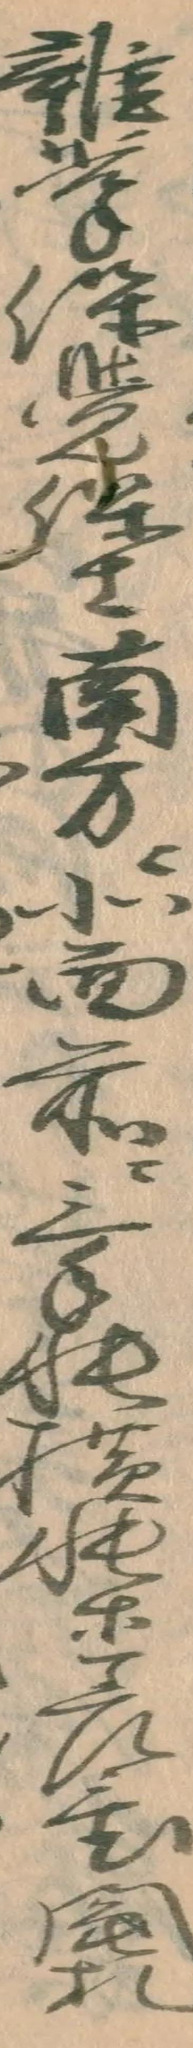雑掌保覚保土南方ニ北面前ニ気帳横帳等差置鬮札
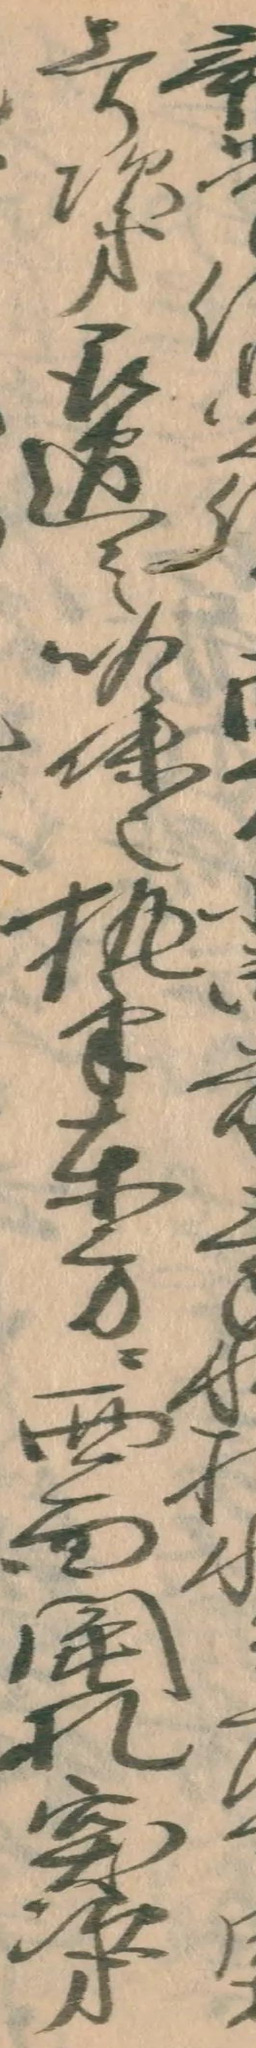上り次第取之吟味也執筆東方ニ西面鬮札突次第
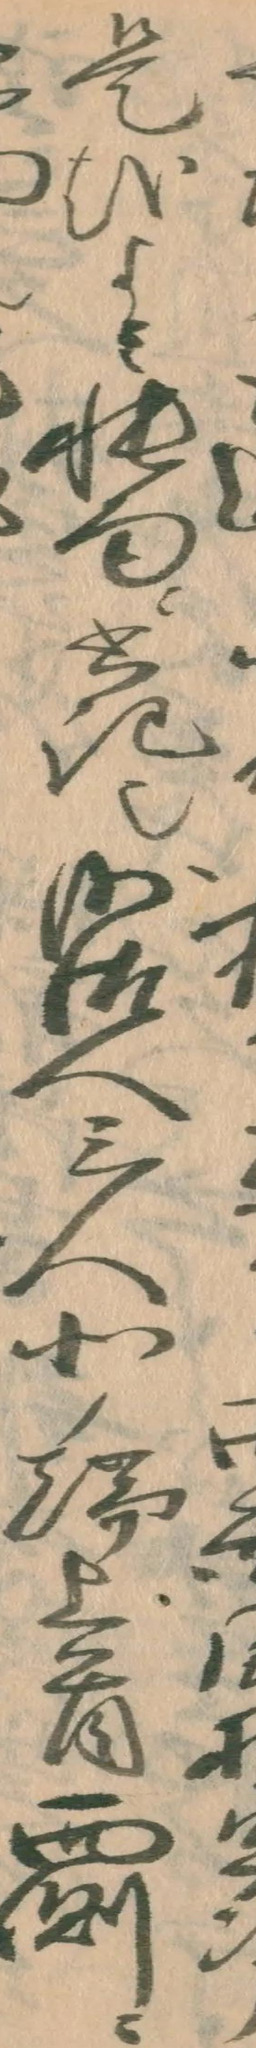是をよミ帳面ニ書記也沙汰人三人北ノ端上首西側ニ
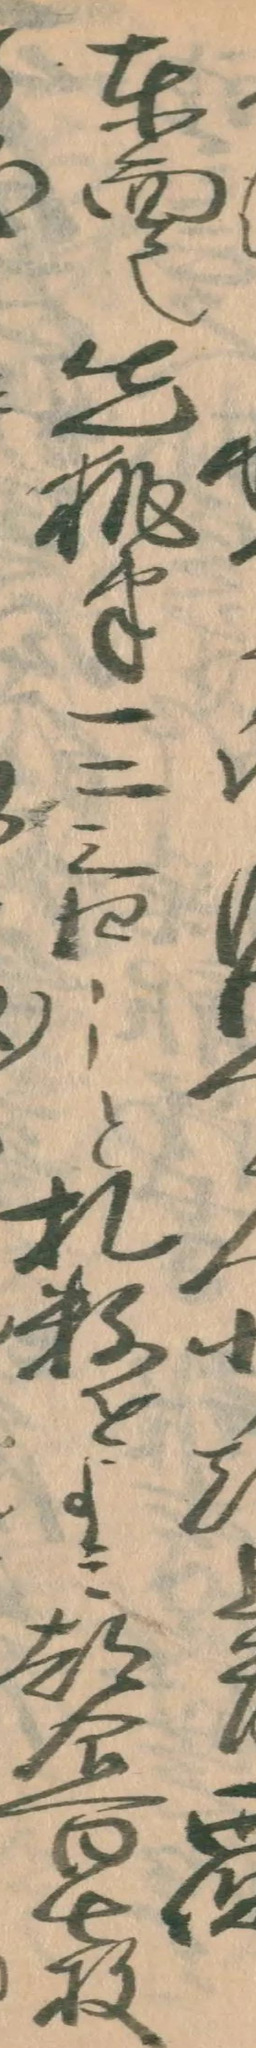東面也先執筆一二三四❘❘と札数をよミ都合百七枚
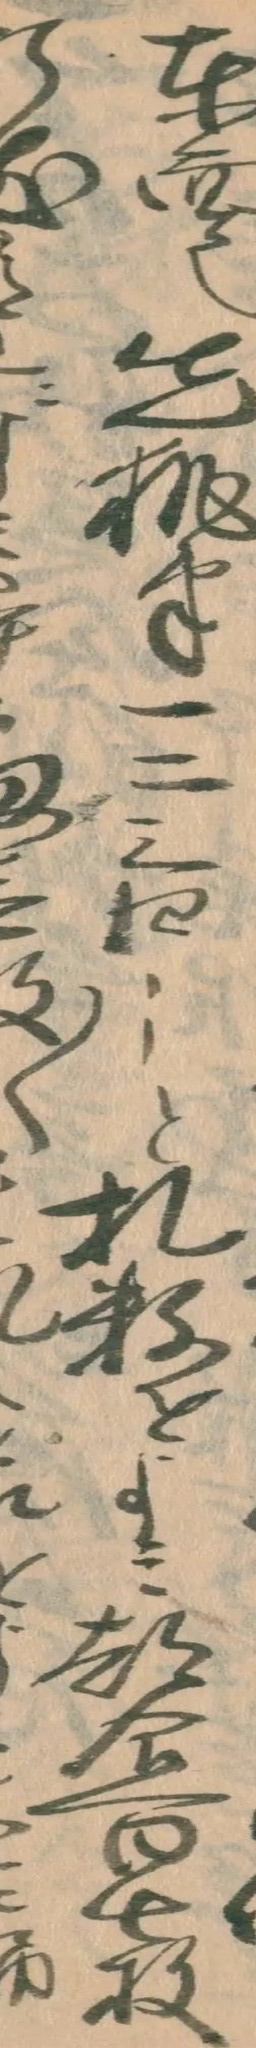東面也先執筆一二三四❘❘と札数をよミ都合百七枚
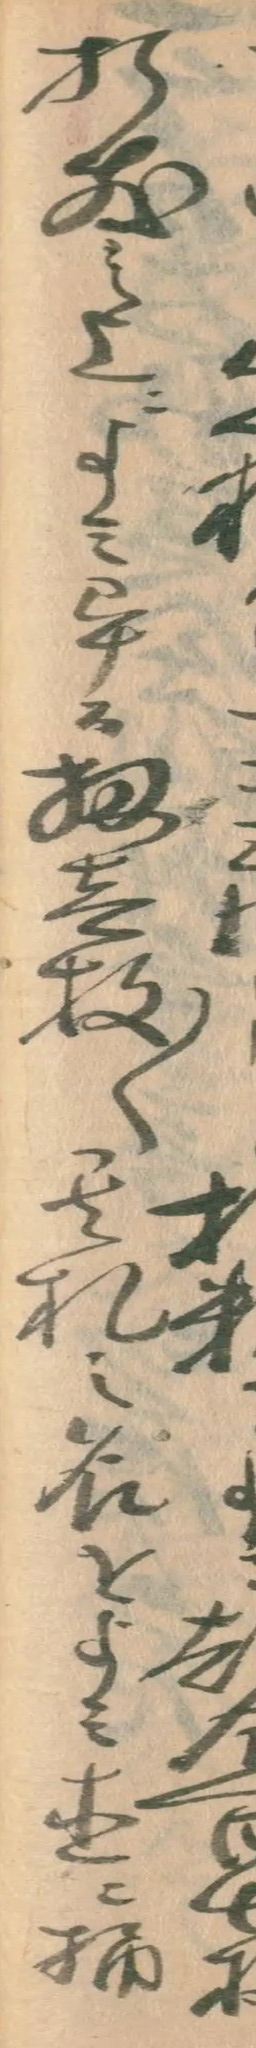折敷之上ニよミ畢而扨壱枚〳〵其札之名をよミ直ニ桶
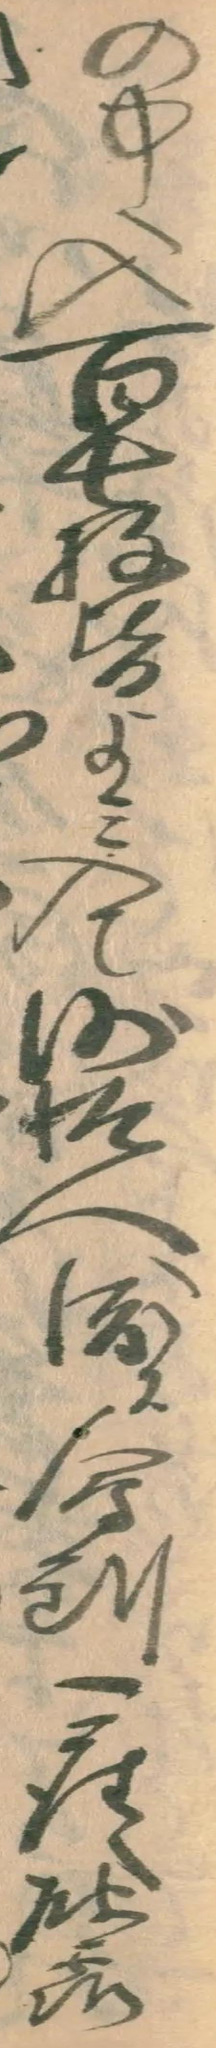の中へ入百七枚皆よミ入て沙汰人へ渡ス会所一座へ披露
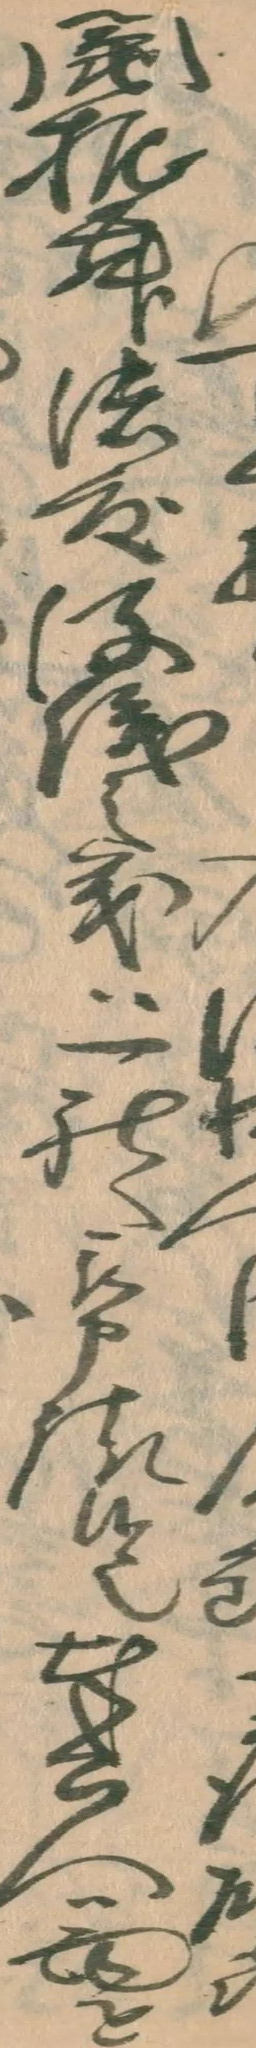鬮振舞法度役儀之義ハ一社へ被申請候也奉公人ハ面を
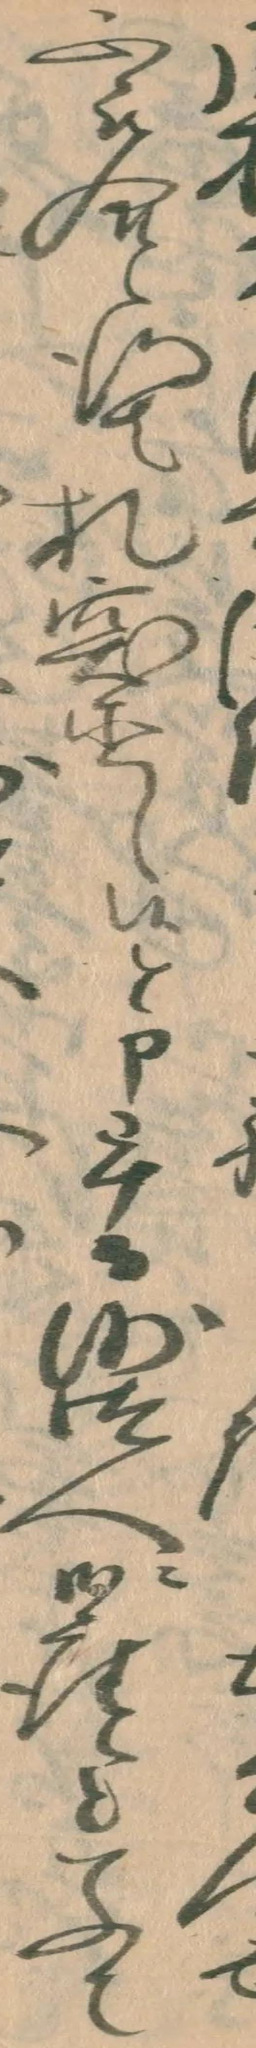不被合候得者札突直し候と申畢而沙汰人ニ御座候といふて
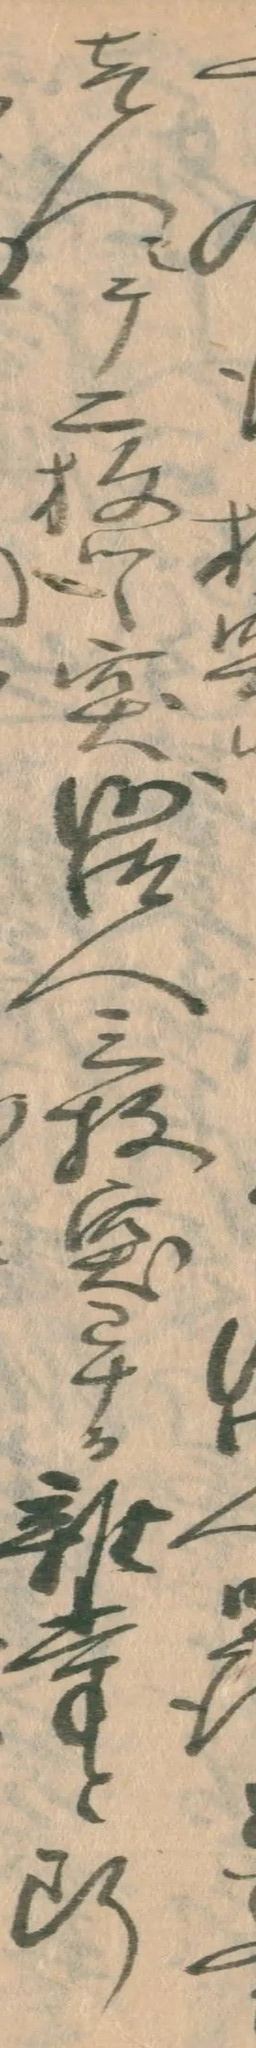壱人ニテ二枚ツヽ突沙汰人三枚突畢而雑掌と断
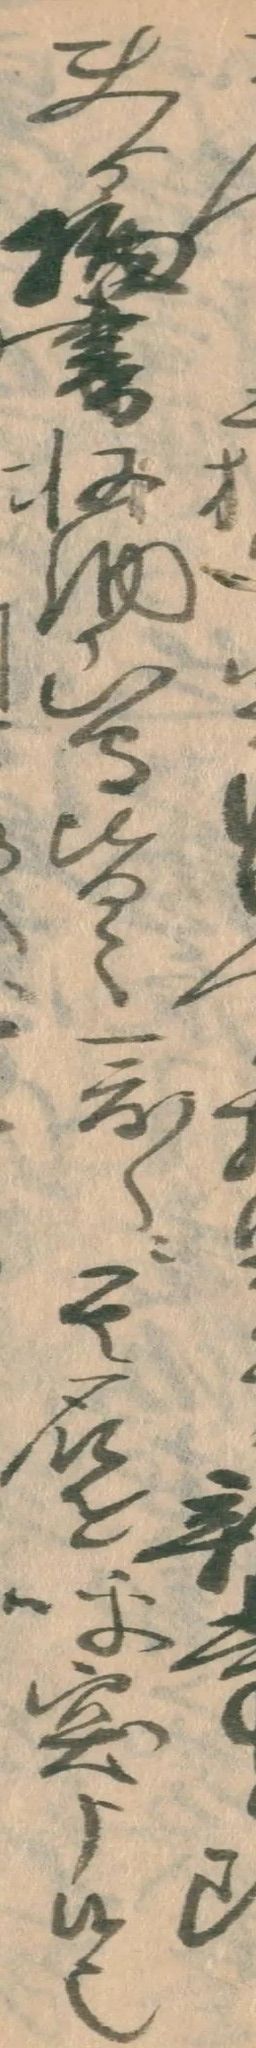夫ゟ物書収納山守皆々一度〳〵ニ其名を呼突申候也
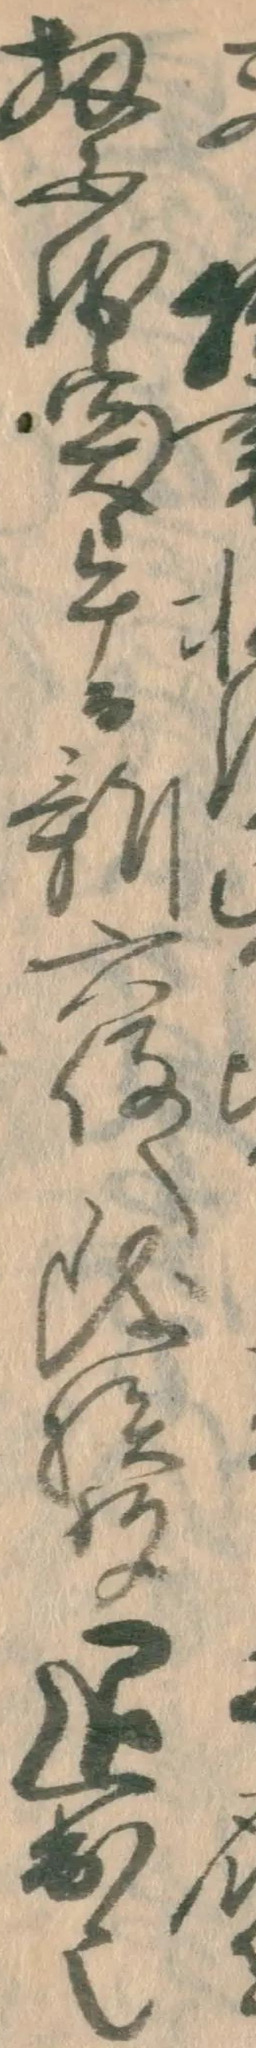扨不残突畢而新六役へ致挨拶退出也
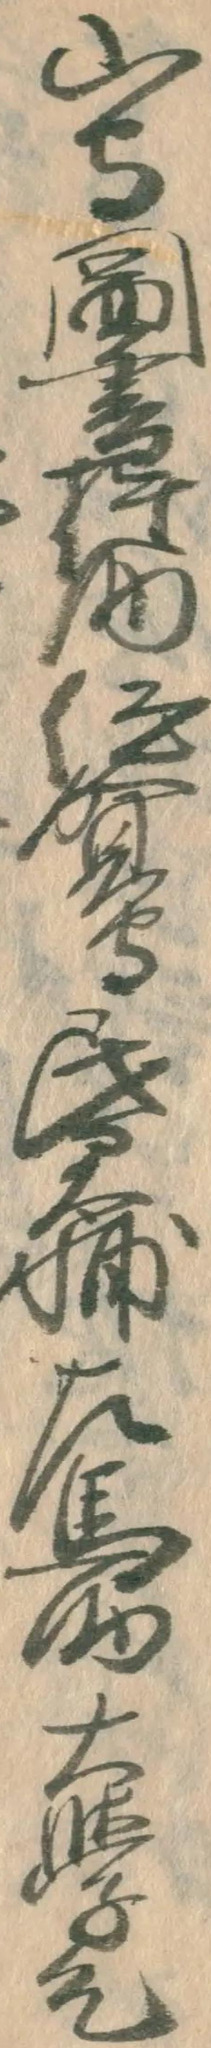山守図書権助伊賀守民部太輔左馬助大学允
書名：賀茂社記録. 第60冊
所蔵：国立国会図書館 National Diet Library, JAPAN
